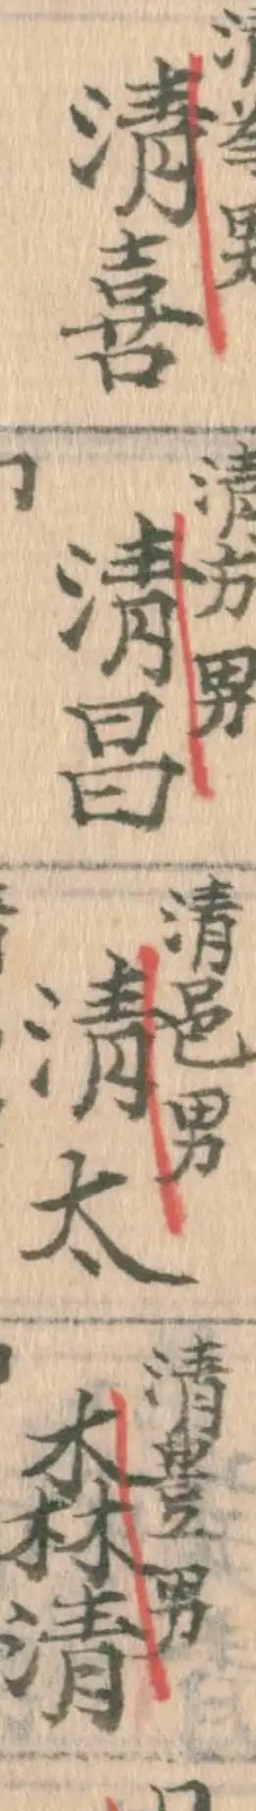清喜清昌清太森清封清
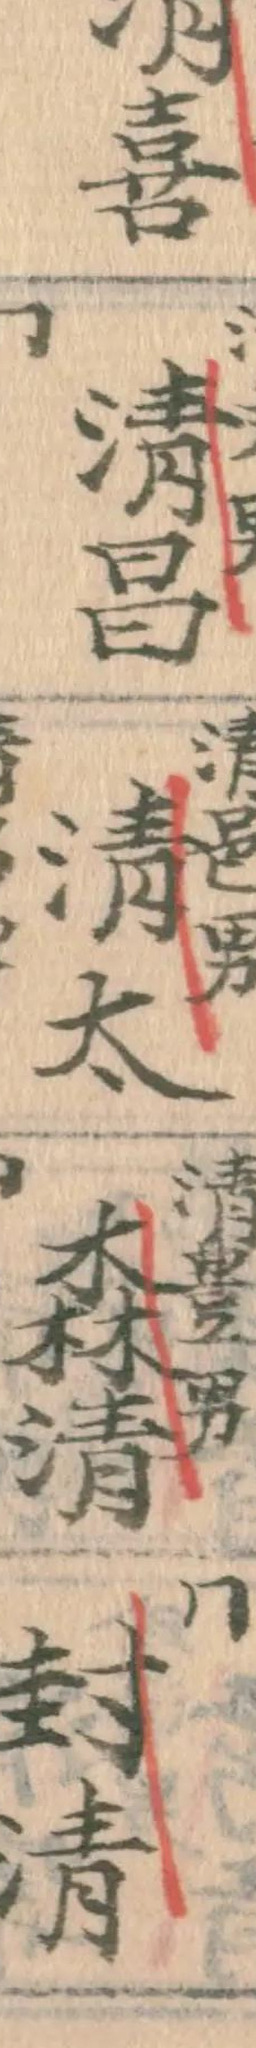清喜清昌清太森清封清
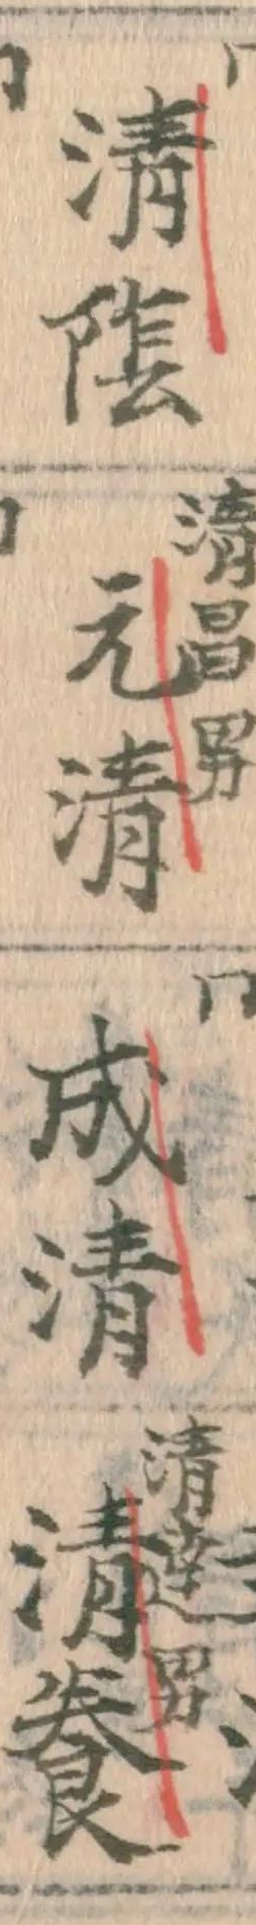清陰元清成清清養
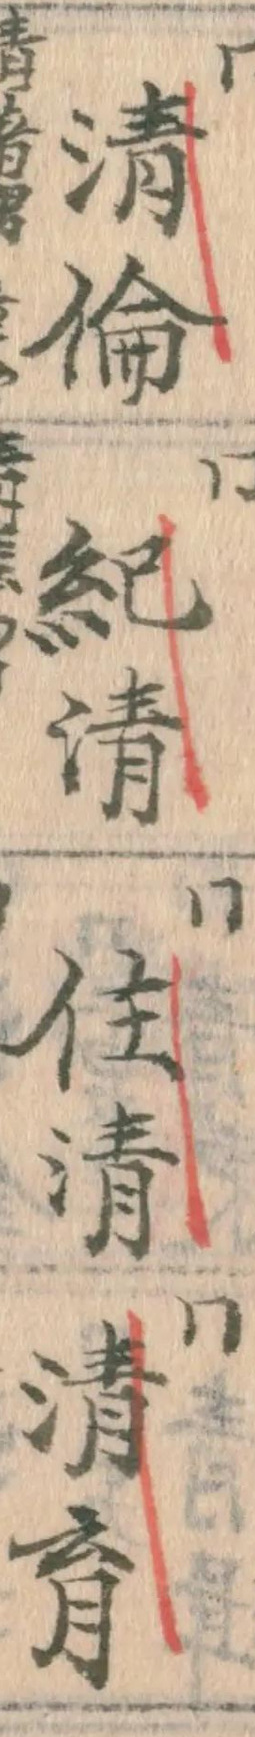清倫紀清住清清育
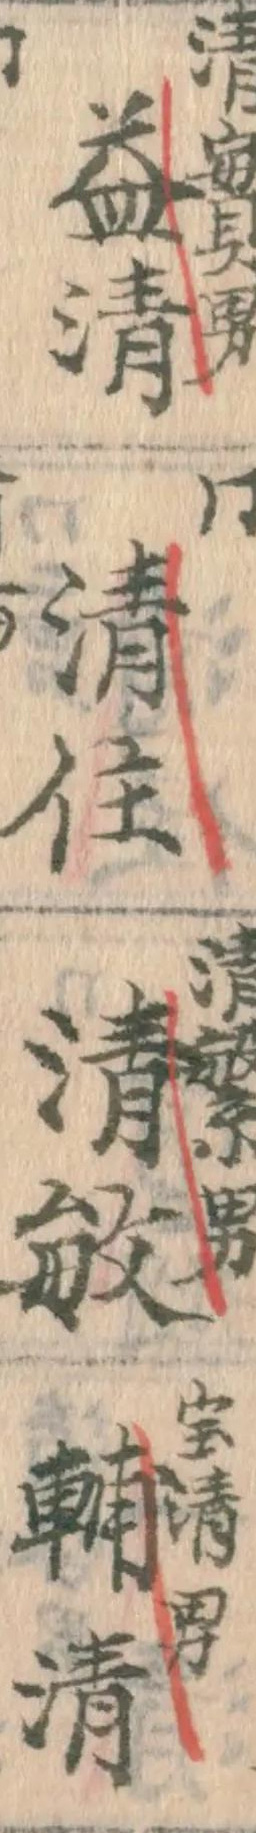益清清住清敏輔清
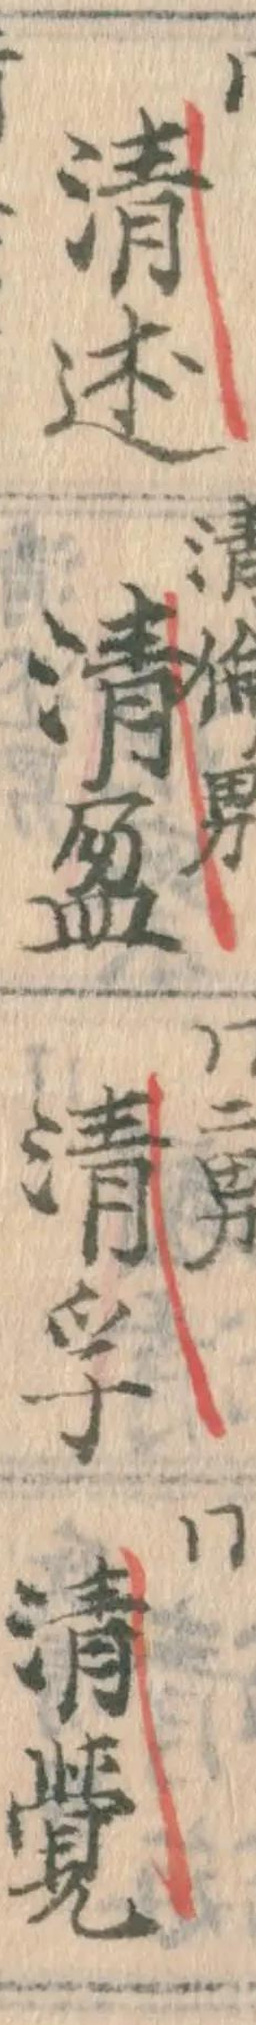清述清盈清孚清覚
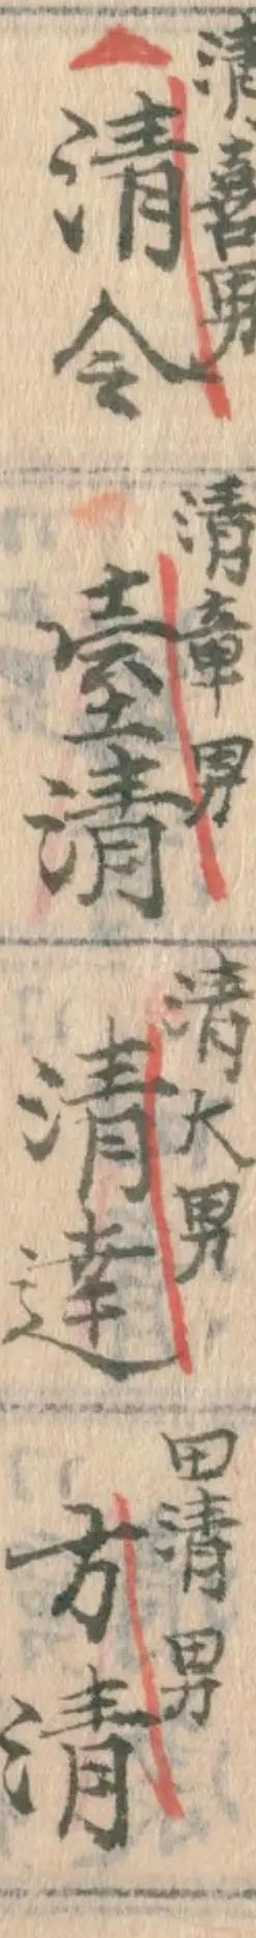▲清令台清清達方清
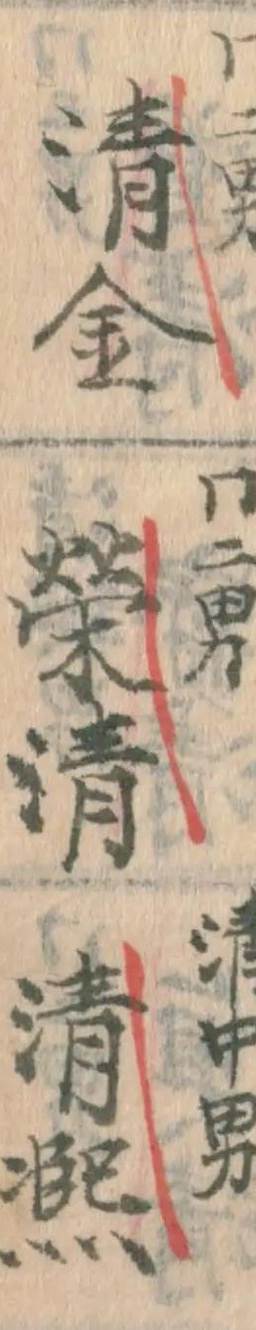清金栄清清凞

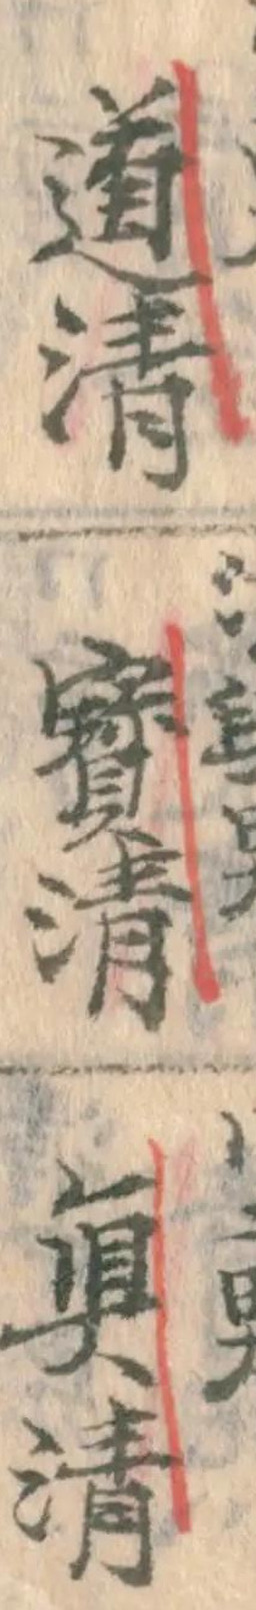道清宝清眞清
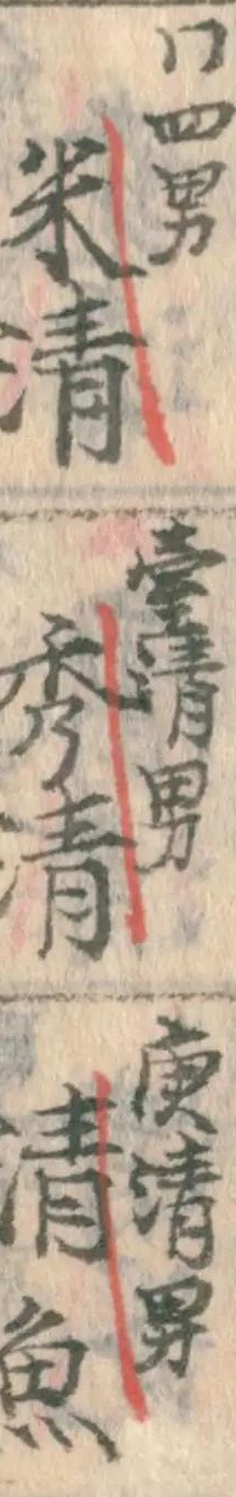米清秀清清魚
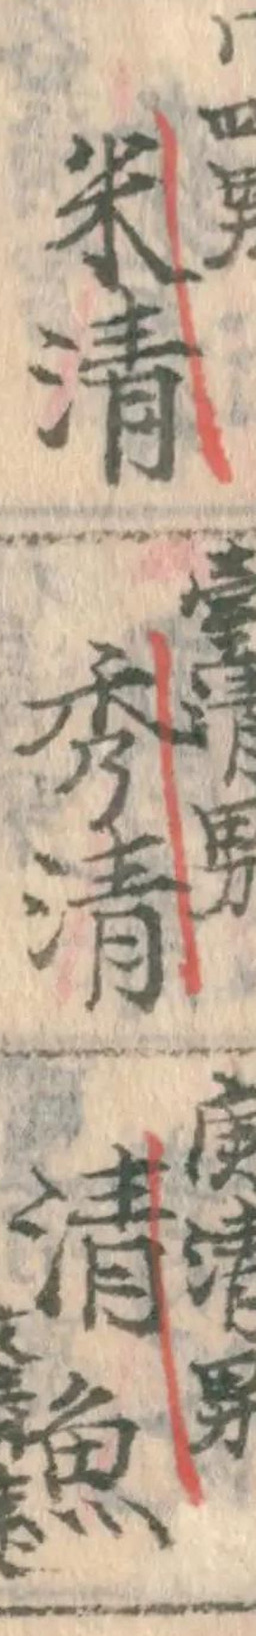米清秀清清魚
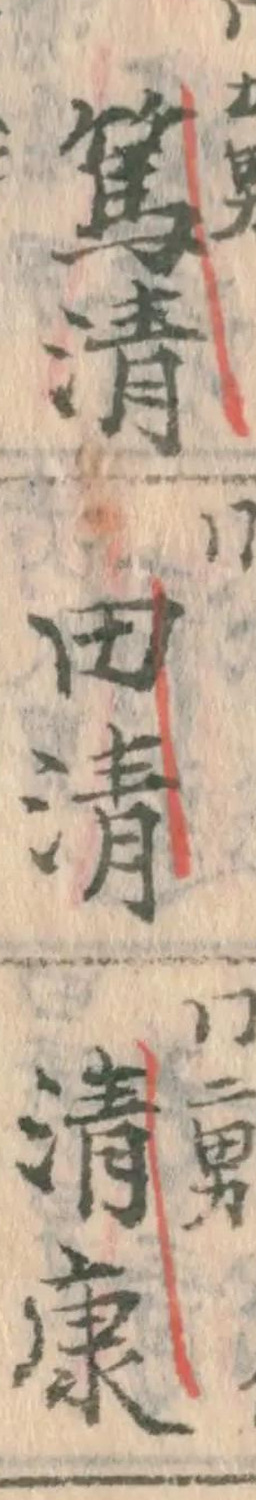篤清田清清康
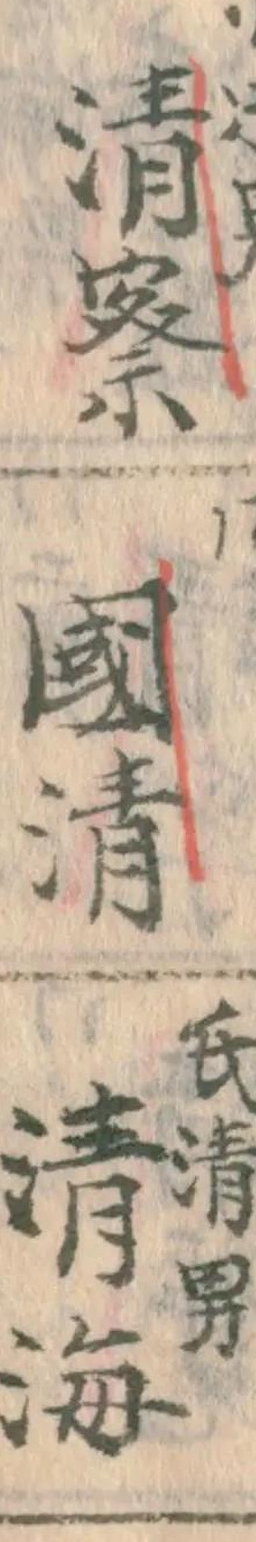清察国清清海
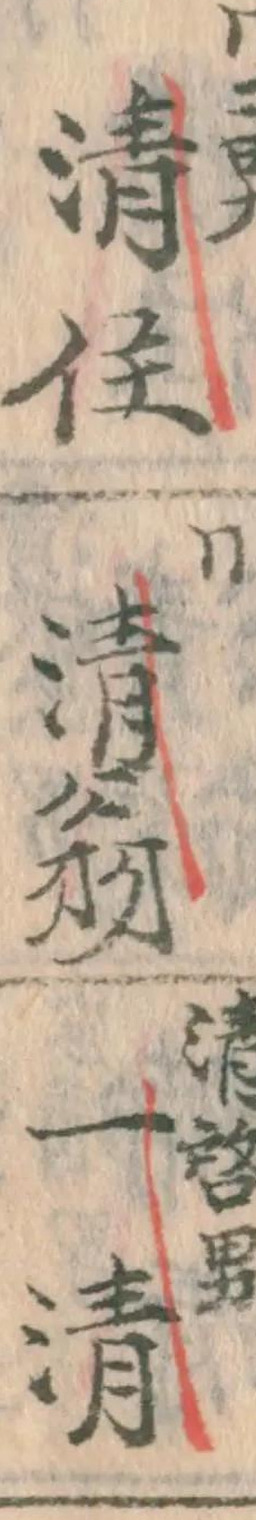清住清翁一清
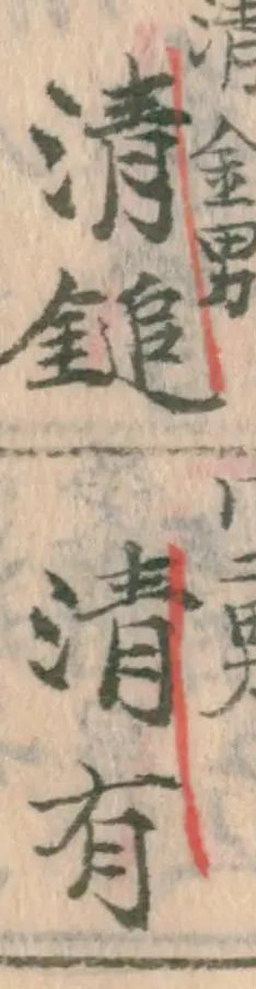清鎚清有
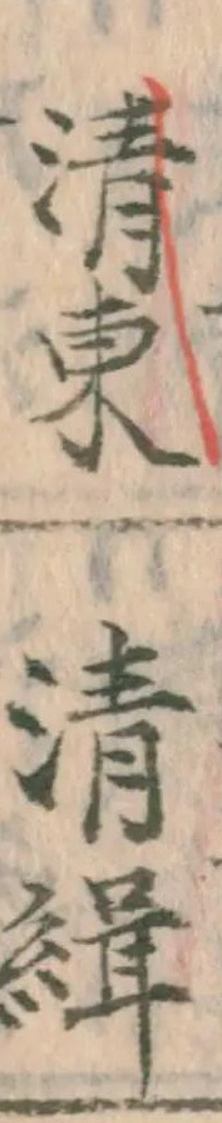清東清緝
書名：賀茂社記録. 第24冊
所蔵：国立国会図書館 National Diet Library, JAPAN
